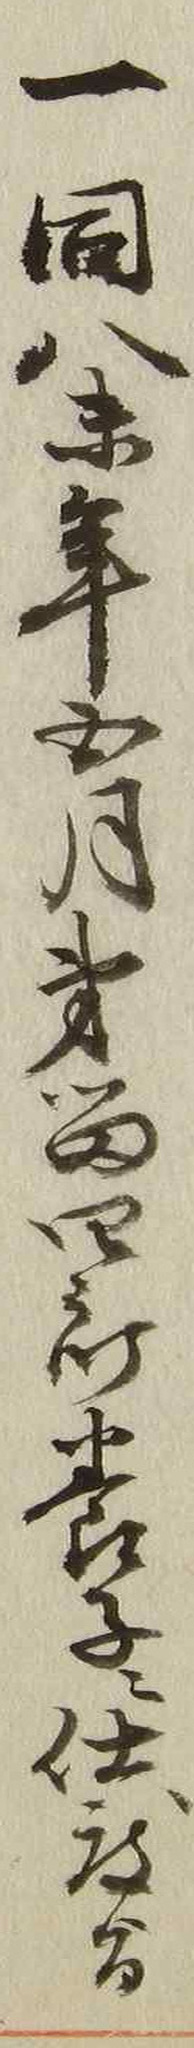一同八未年五月弟留四郎養子ニ仕度旨
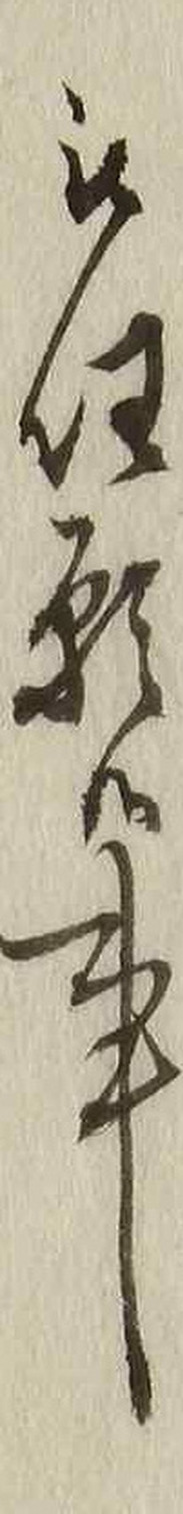被任願候事
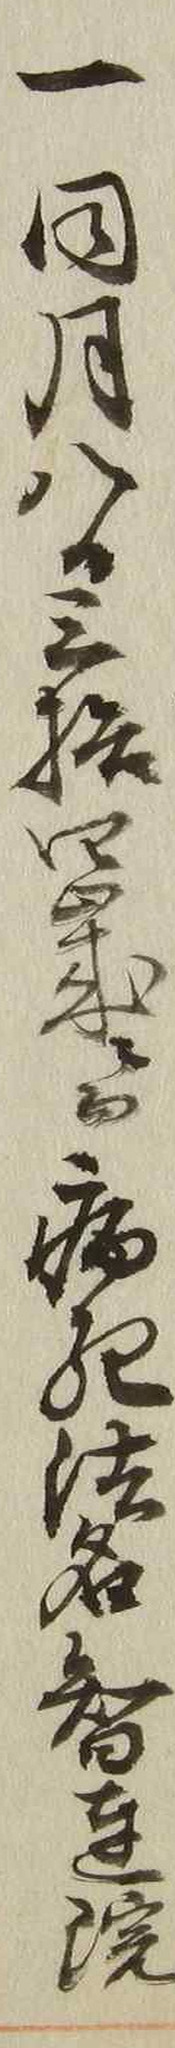一同月八日三拾四歳ニ而病死法名智達院
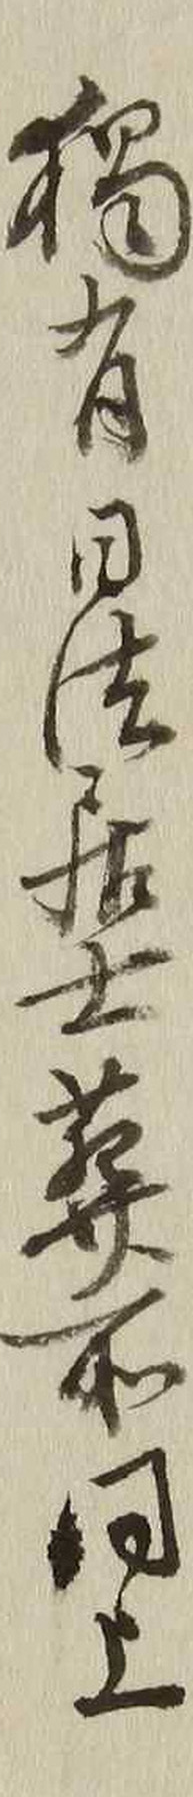独有日法居士葬所同上
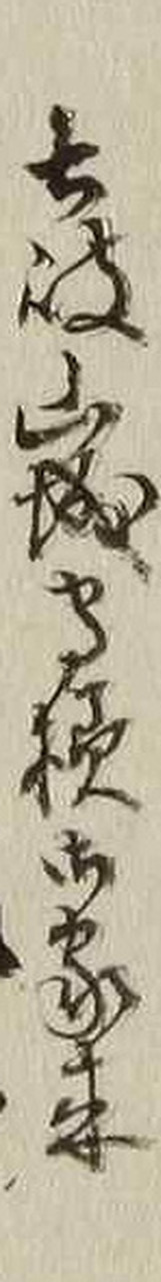土岐山城守様御家来
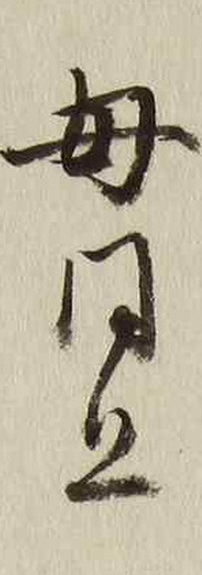母同上
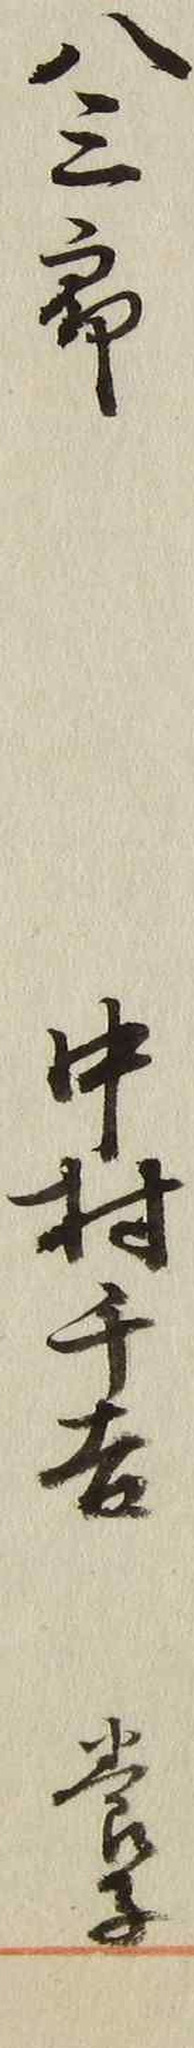八三郎中村千吉養子
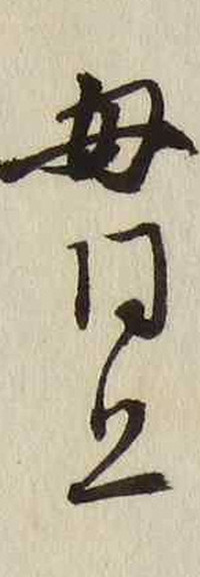母同上
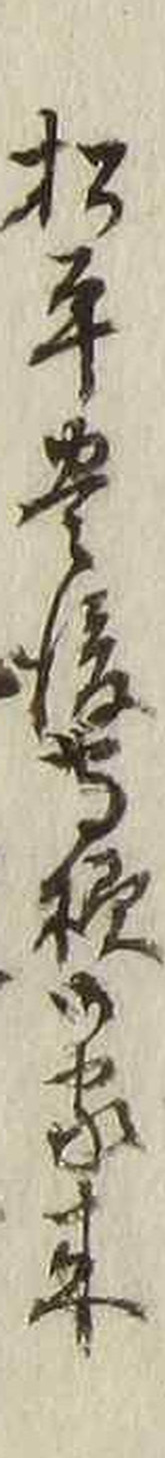松平豊後守様御家来
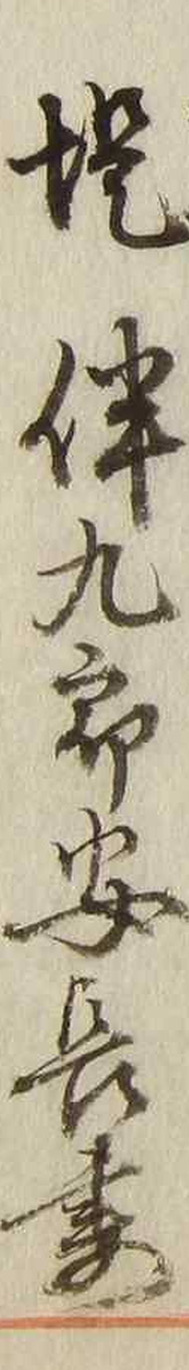女堤伴九郎安長妻

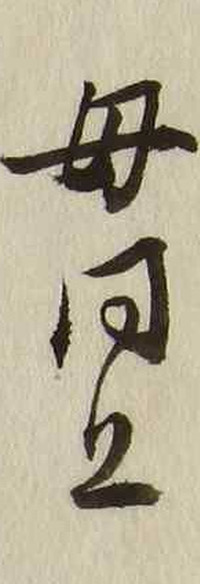母同上
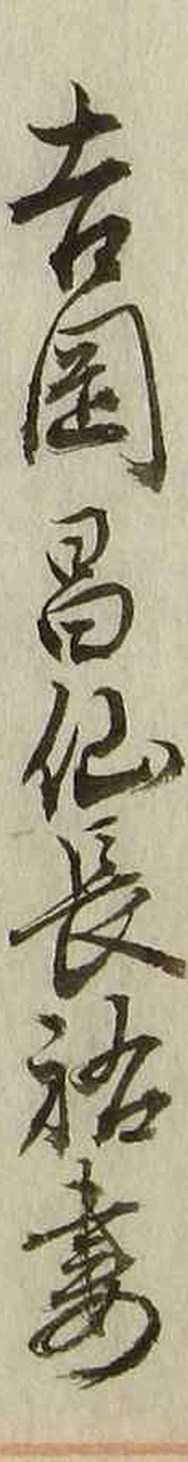女吉岡昌仙長祐妻
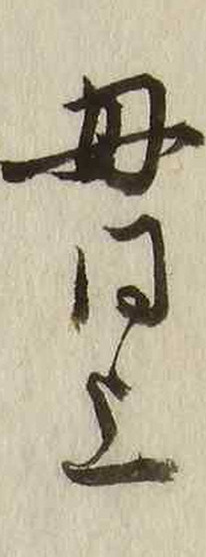母同上
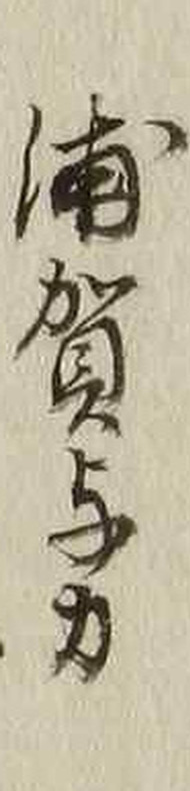浦賀与力
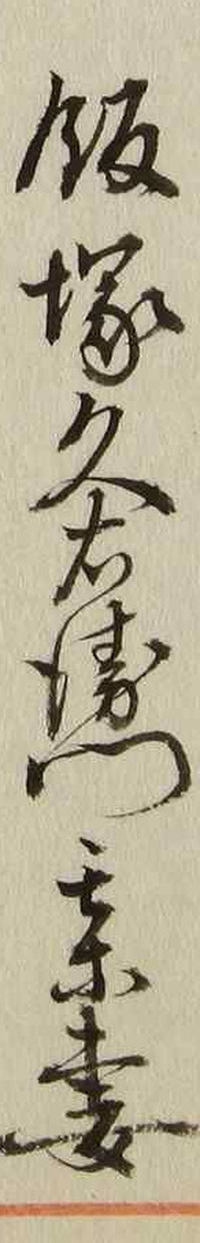女飯塚久右衛門某妻
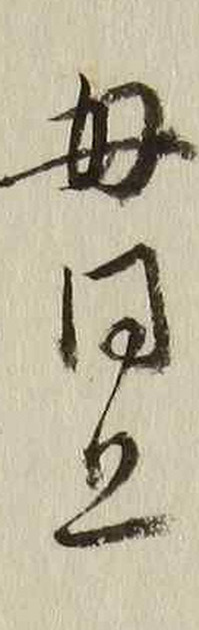母同上
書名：諸士系譜　巻之23　い之部23
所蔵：会津若松市立会津図書館
